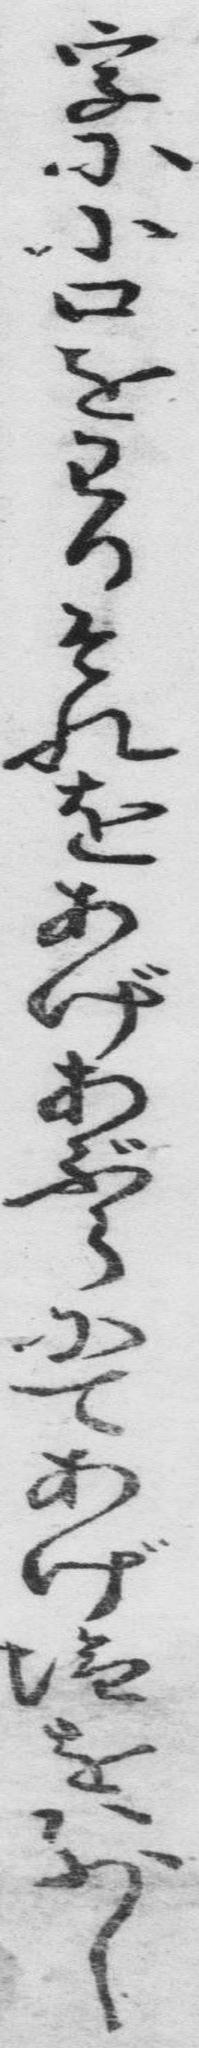字尓小口をわりそれをあげあぶら尓てあげ塩をは少し

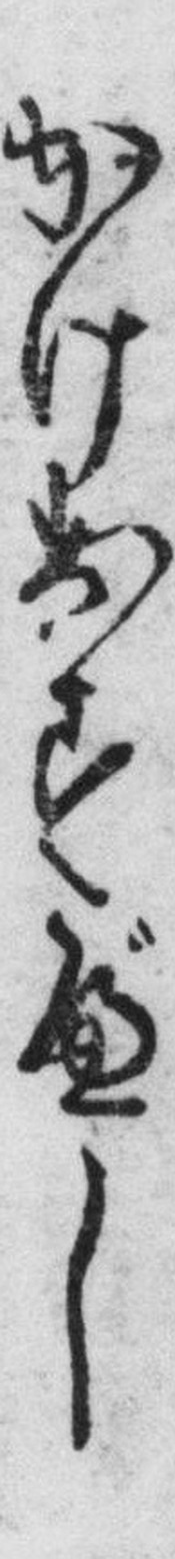かけ出春べし
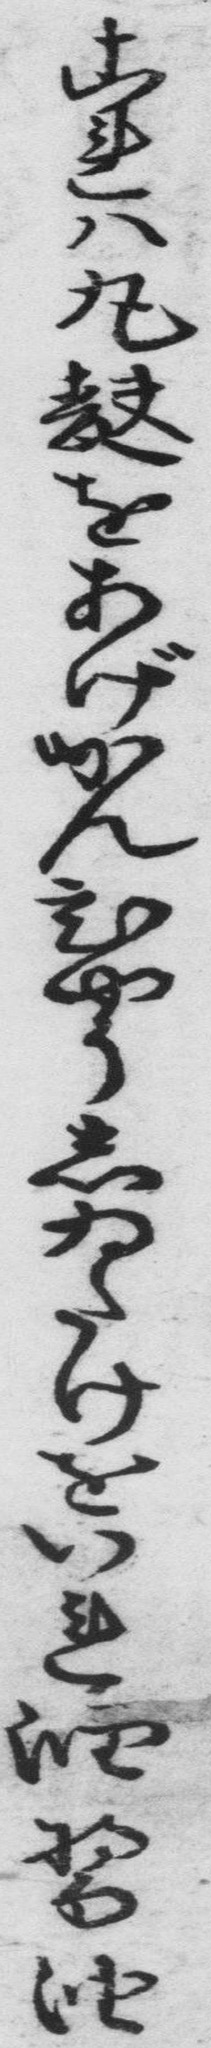古連は丸麩をあげかん飛やう志ゐたけをい連油醤油
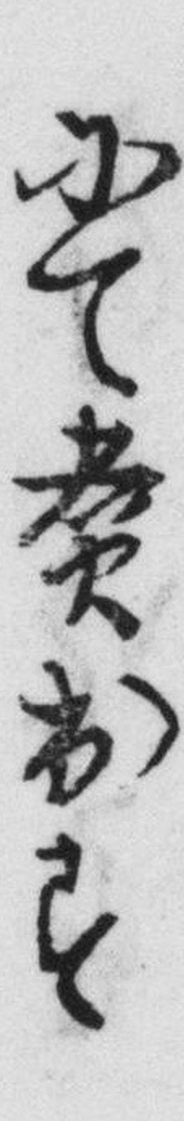尓て煮出春
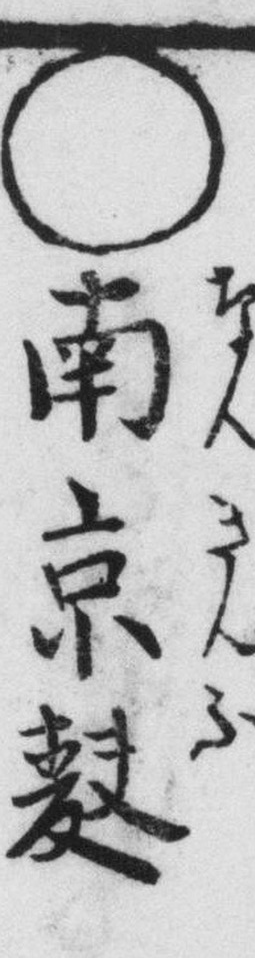〇南京麩
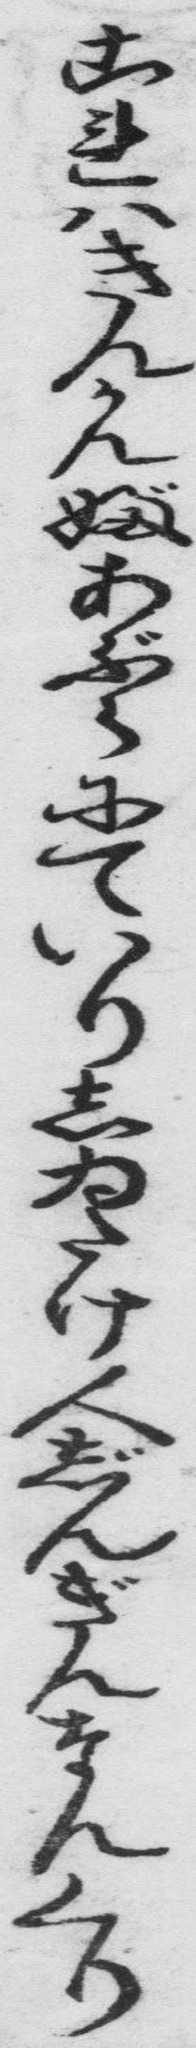古連はきんかんぶあぶら尓ていり志ゐたけ人じんぎんなんくり
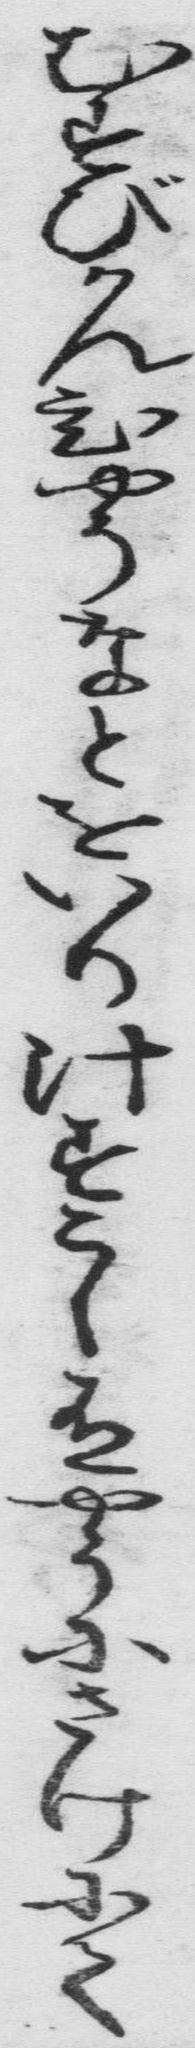む春びかん飛やうなとをいり汁春こし有やう尓せけ尓て
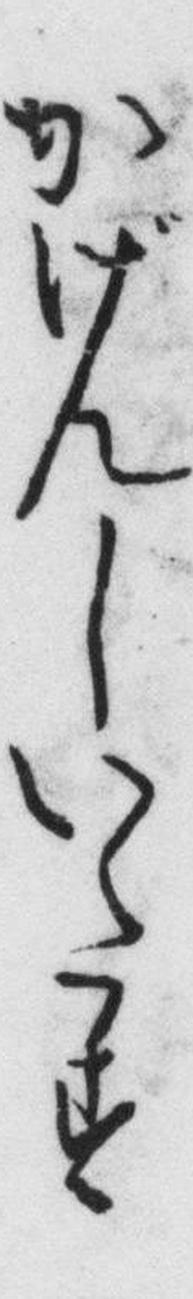かげんしいた春
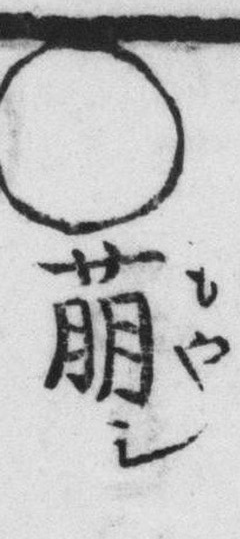〇萌シ
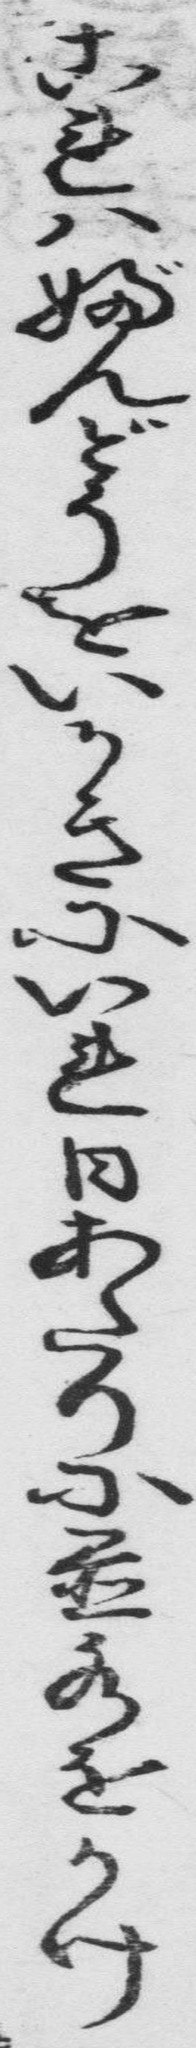古連はぶんどうをいかき尓い連日あたり尓置水をかけ
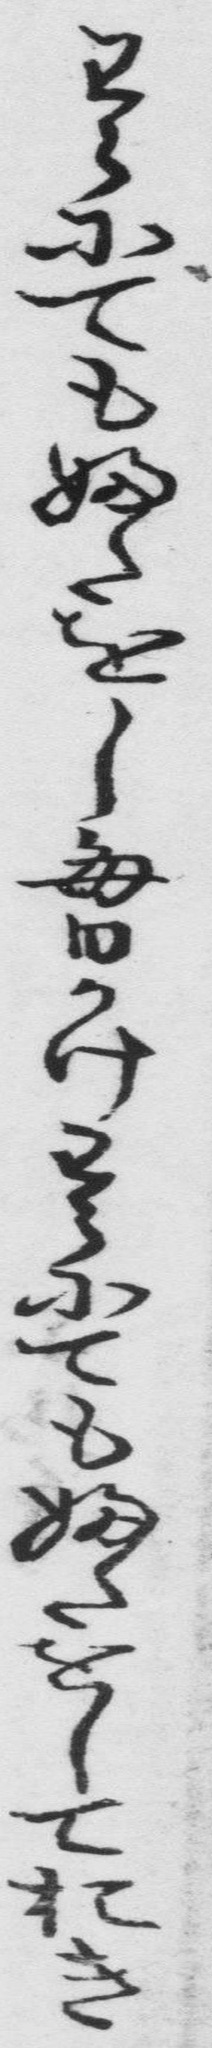わら尓ても婦たをし毎日かけわら尓ても婦たをして於き
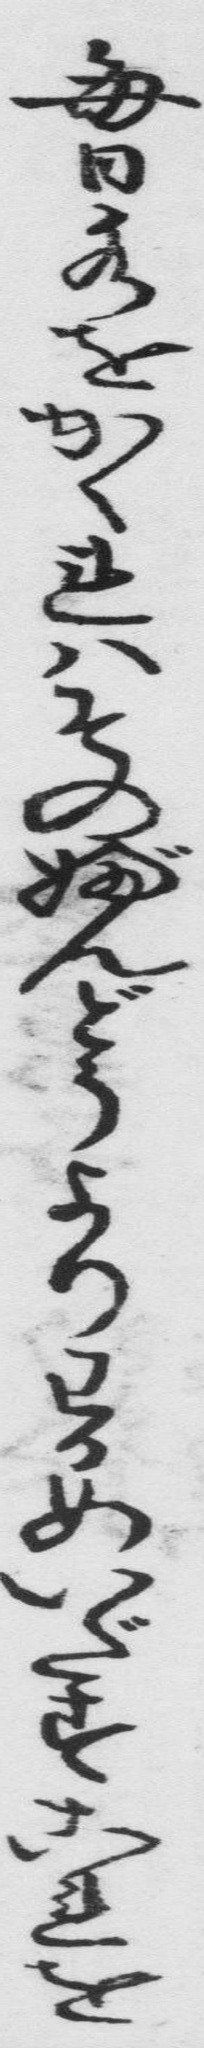毎日水をかく連はそのぶんどうよりわるめいだ春古連を
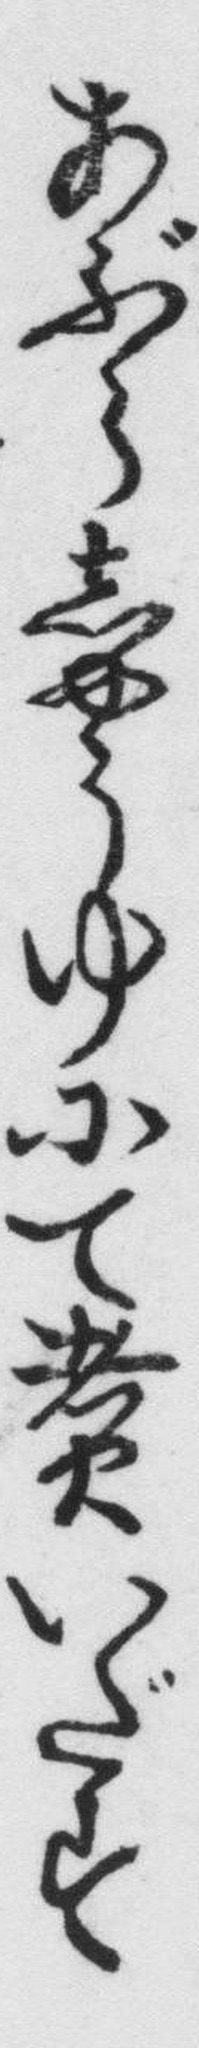あぶら志やうゆ尓て煮い出春
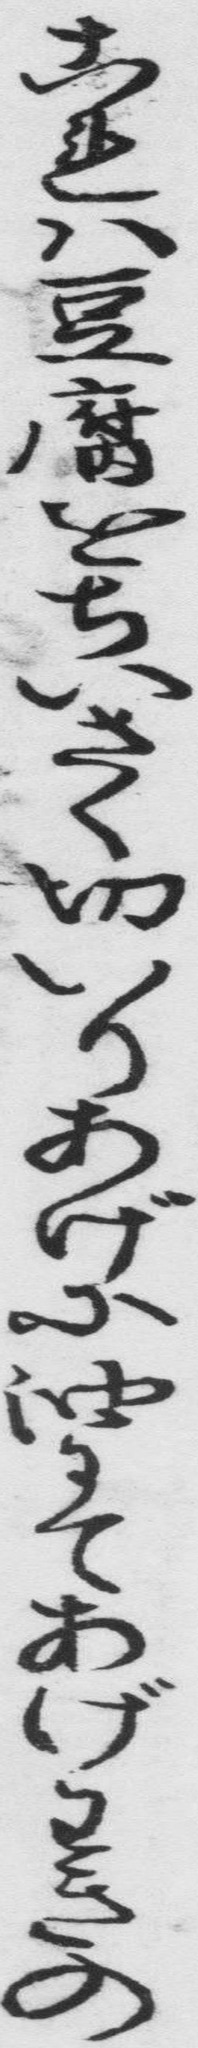古連は豆腐をちいさく切いりあげ尓油尓てあげわきの
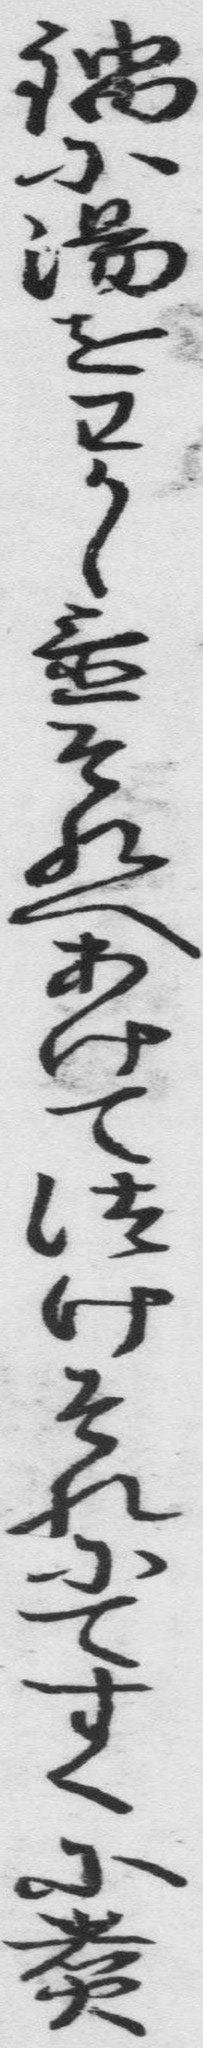鍋尓湯をわかし置それへあけて徒けそれ尓てすく尓煮
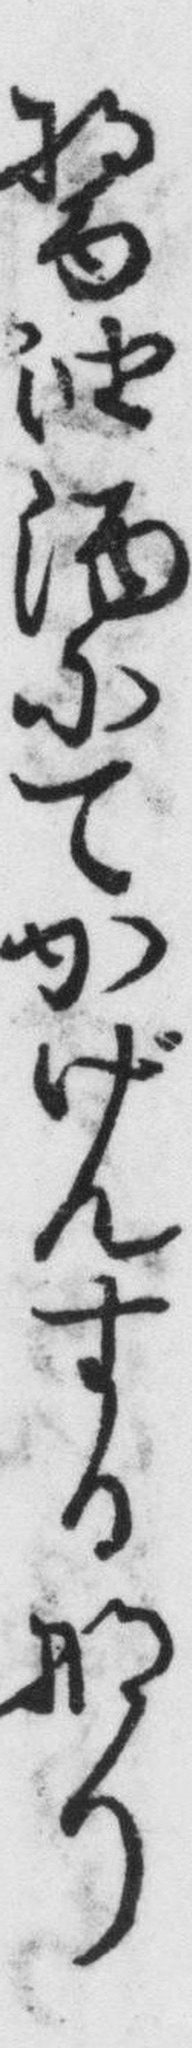醤油酒尓てかげんする那り
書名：普茶料理抄
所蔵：大阪府立大学学術情報センター 国文学研究資料館
